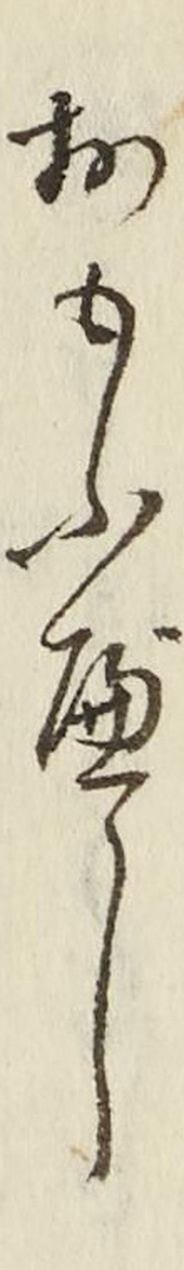おもふへし
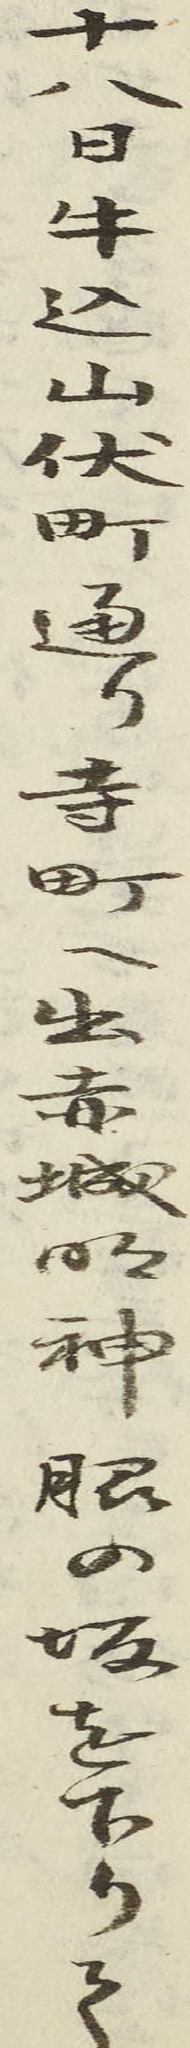十八日牛込山伏町通り寺町へ出赤城明神脇の坂を下りて
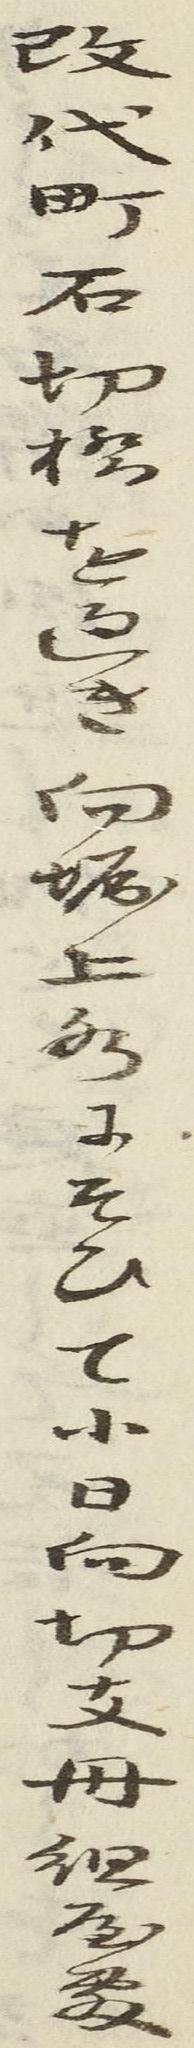改代町石切橋を過き向堀上水にそひて小日向切支丹組屋敷
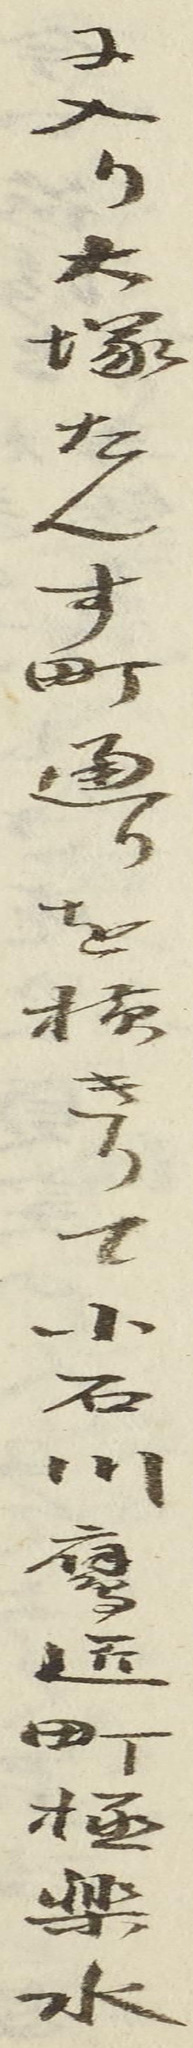に入り大塚たんす町通りを横きりて小石川鷹匠町極楽水
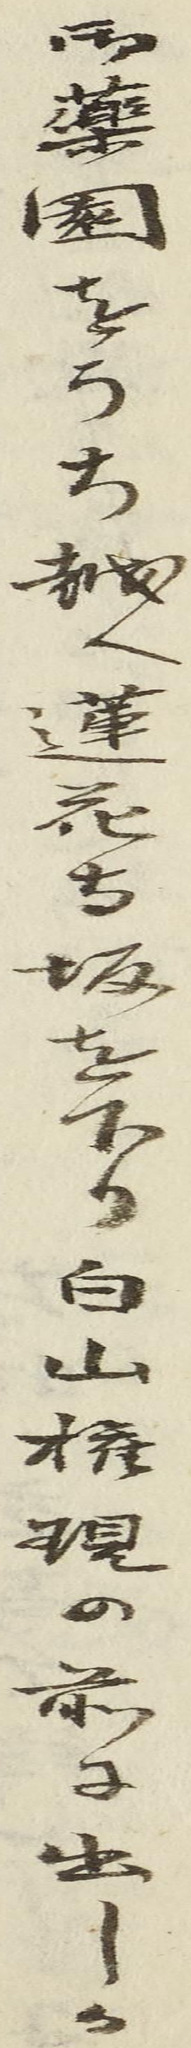御薬園をうち越へ蓮花寺坂を下り白山権現の前に出しか
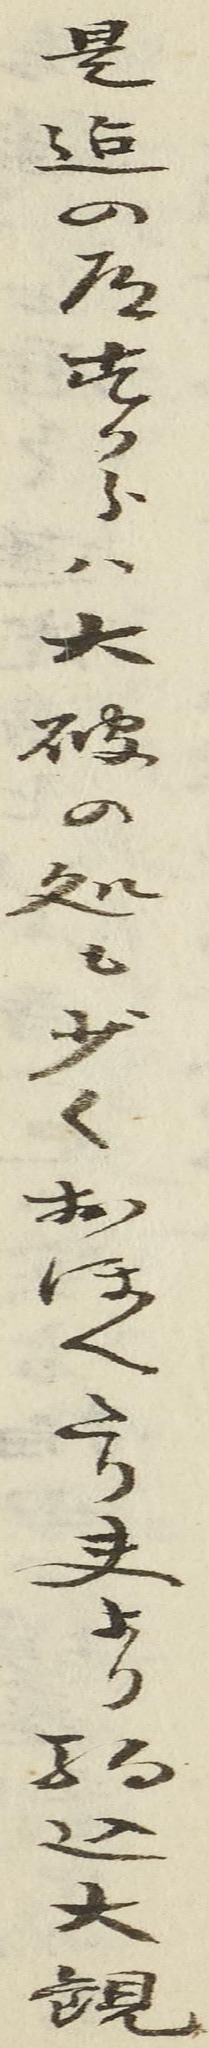是迄の道すからハ大破の処も少くおほへたり夫より駒込大観

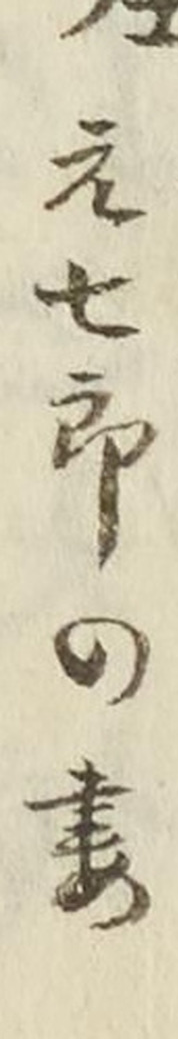元七郎の妻
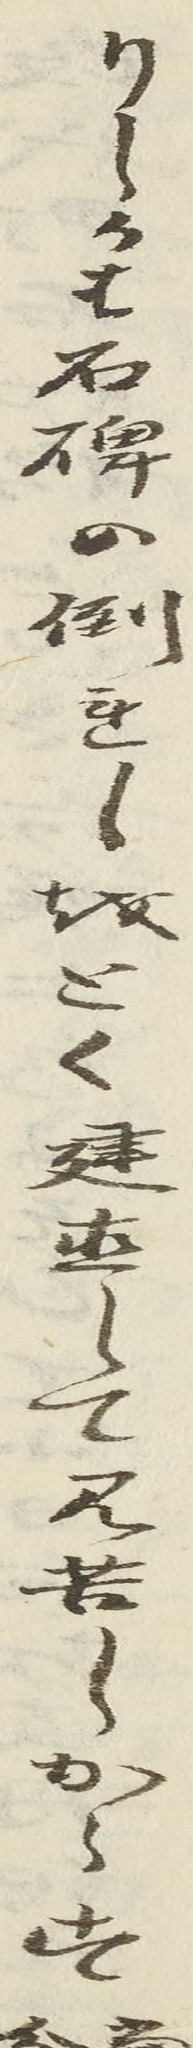りしかは石碑の倒れしをとく建直して見苦しからす当今
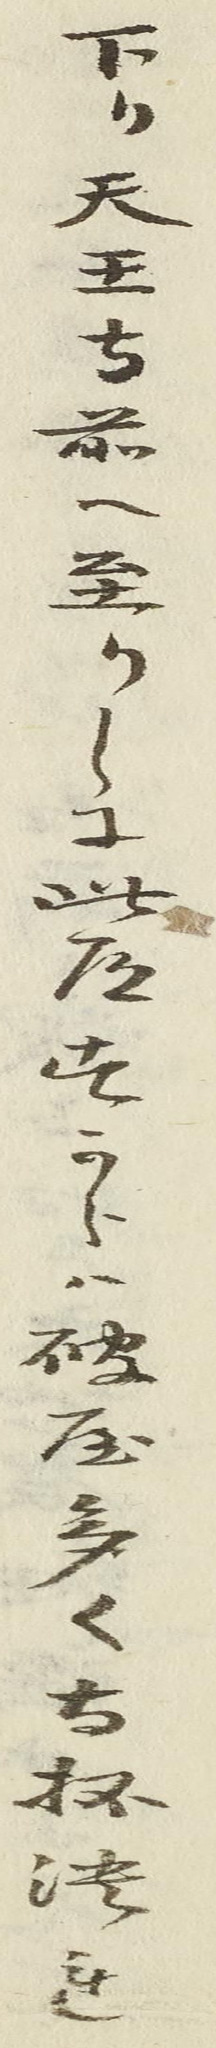下り天王寺前へ至りしに此道すからハ破屋多く寺抔潰れ
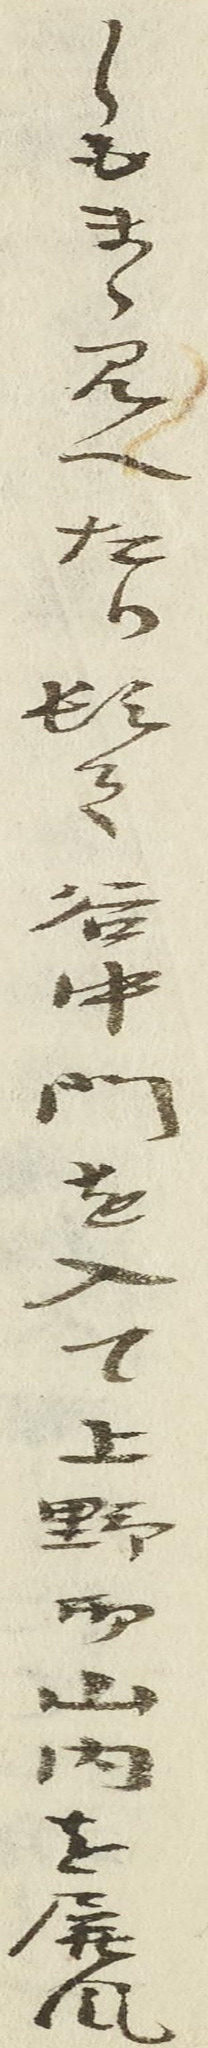しもまゝ見へたり頓て谷中門を入て上野御山内を屏風
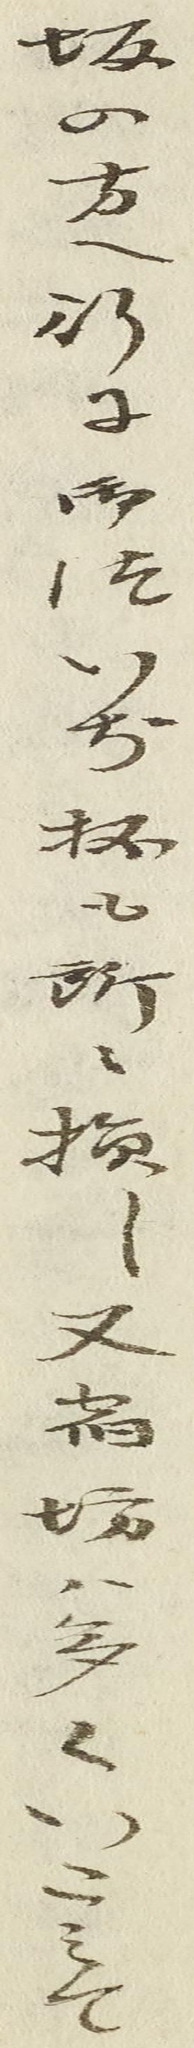坂の方へ行に御ついぢ抔も所々損し又宿坊ハ多くいたミて
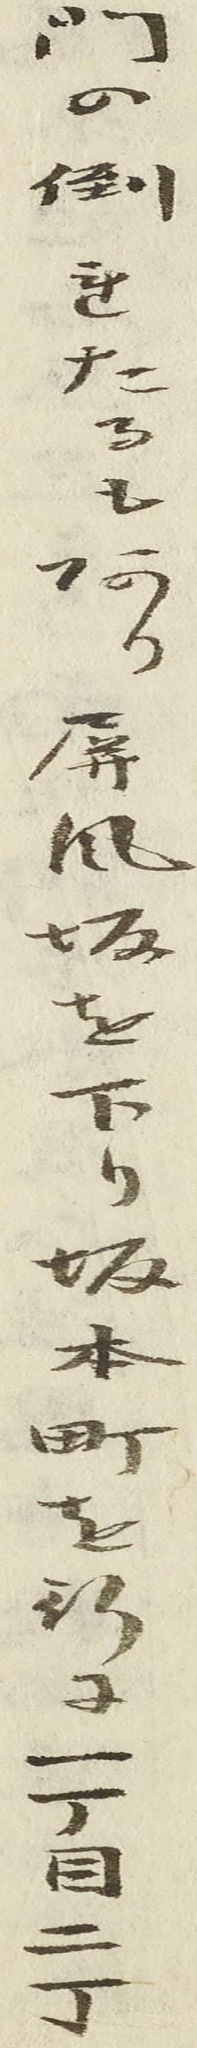門の倒れたるもあり屏風坂を下り坂本町を行に一丁目二丁
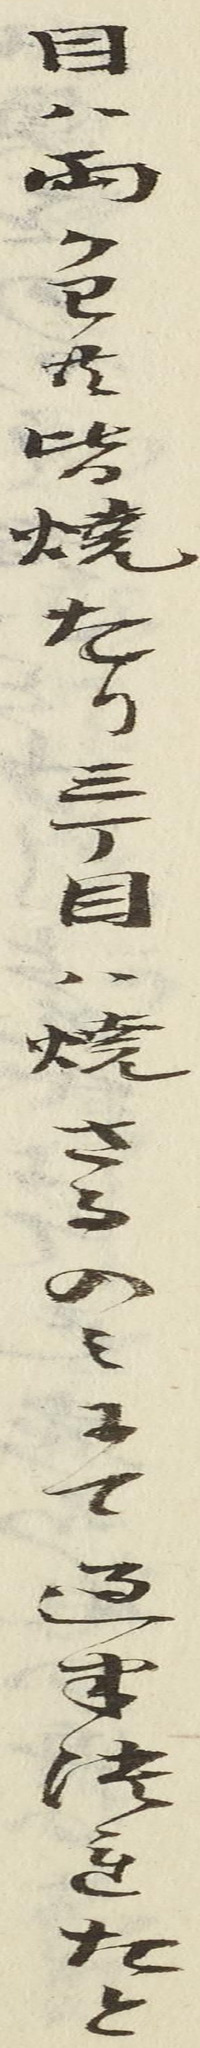目ハ両かわ共皆焼たり三丁目ハ焼さるのミにて過半潰れたと
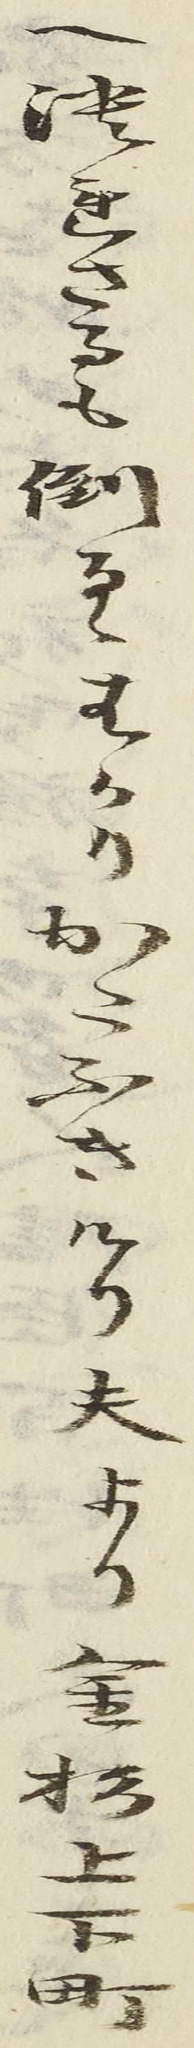へ潰れさるも倒るゝはかりかたふきけり夫より金杉上下町
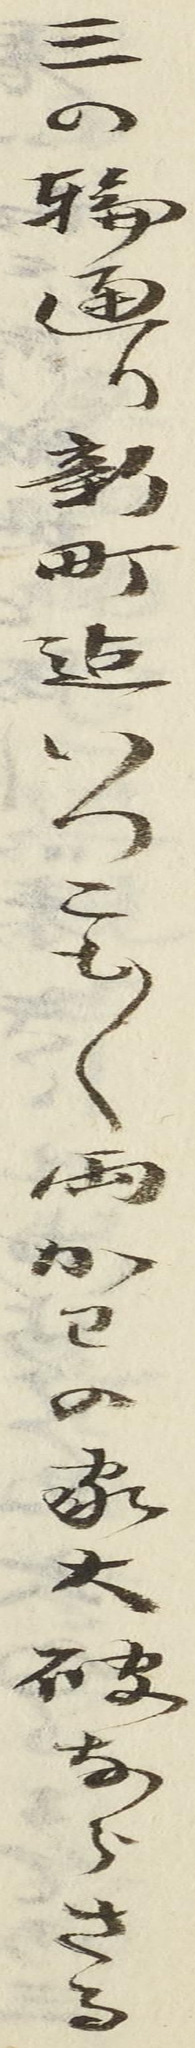三の輪通り新町迄いつこも両かわの家大破ならさる
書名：那為の後見艸　全
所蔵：東京大学地震研究所図書室 Earthquake Research Institute Library, The University of Tokyo, JAPAN
